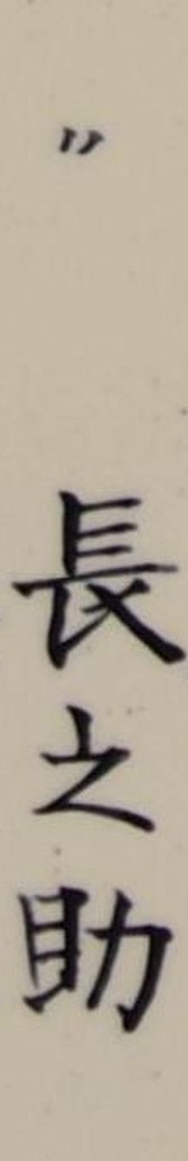長之助
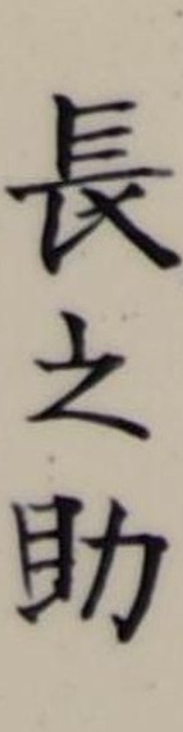長之助
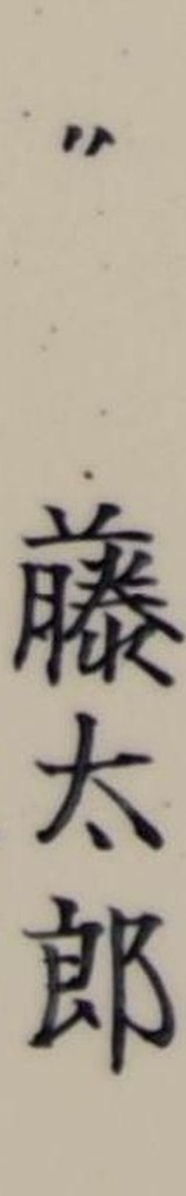藤太郎
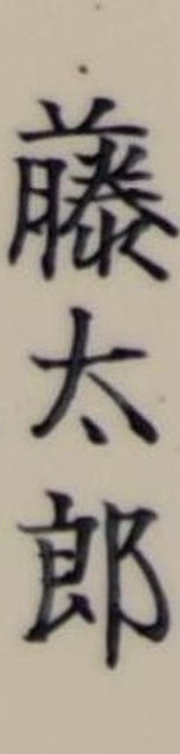藤太郎
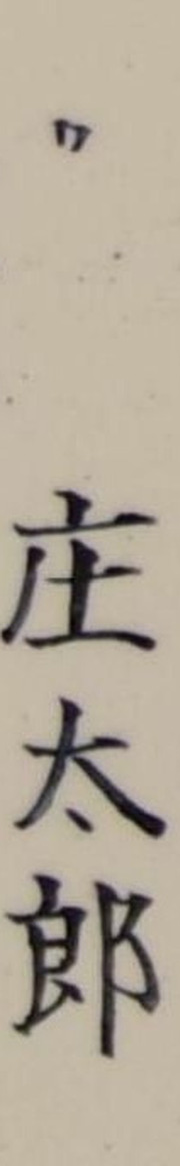庄太郎
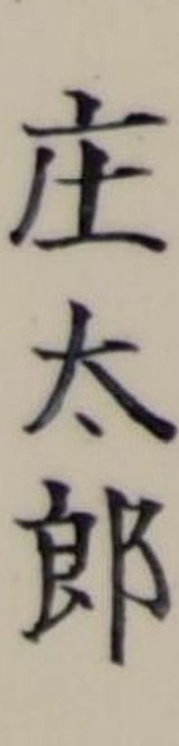庄太郎

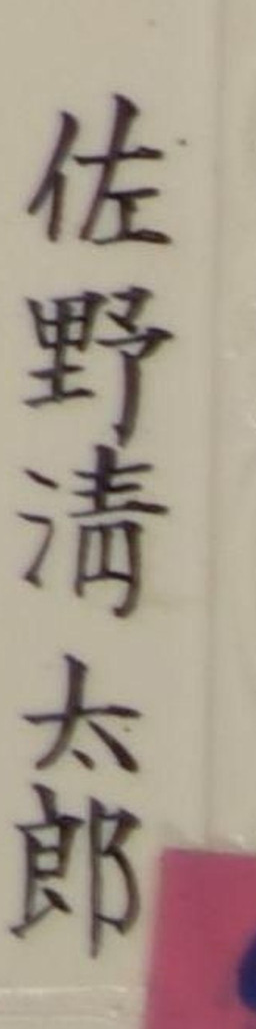佐野清太郎
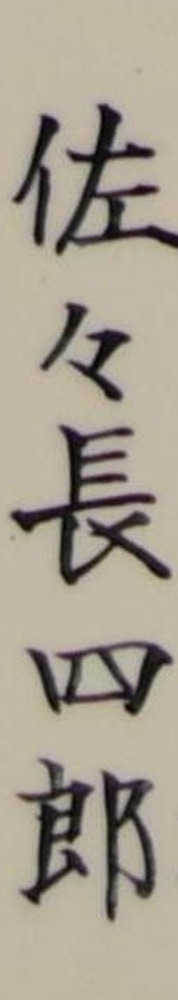佐々長四郎
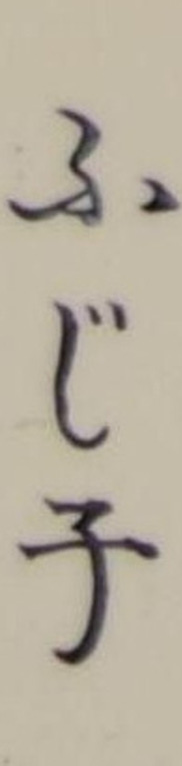ふじ子
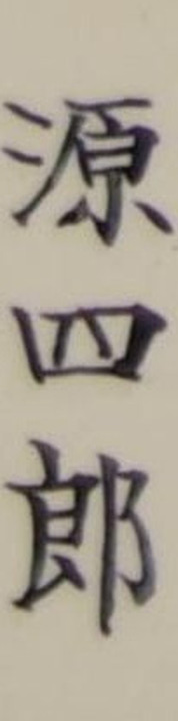源四郎
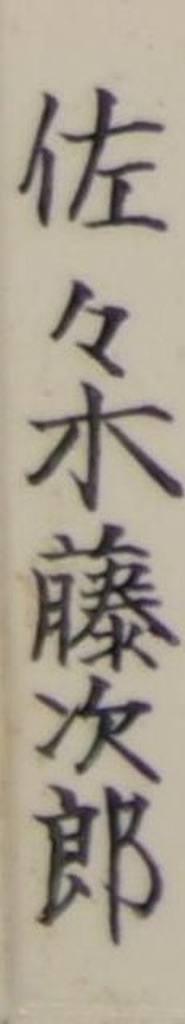佐々木藤次郎

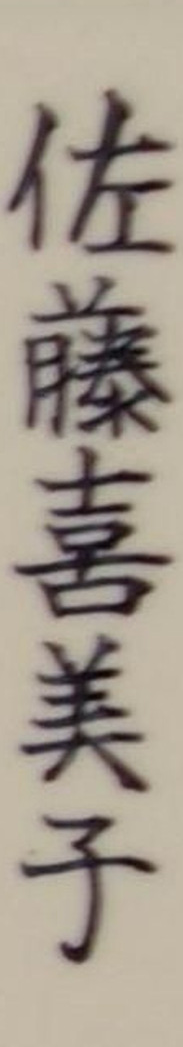佐藤喜美子
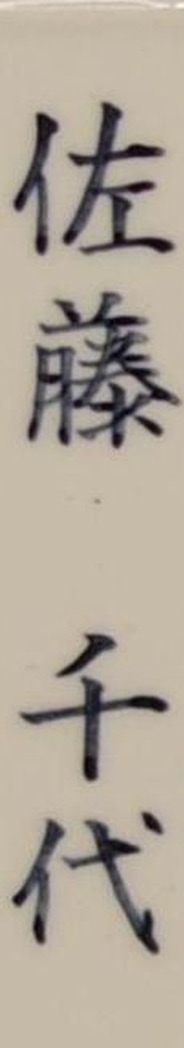佐藤千代
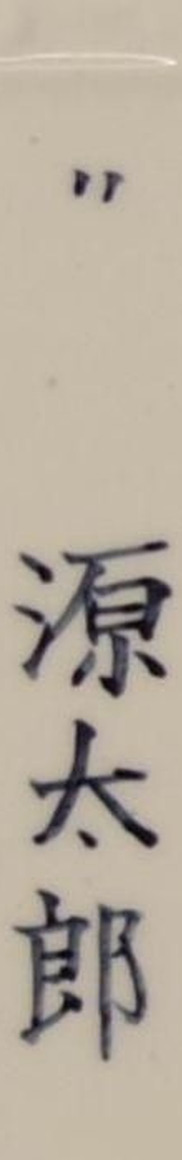源太郎
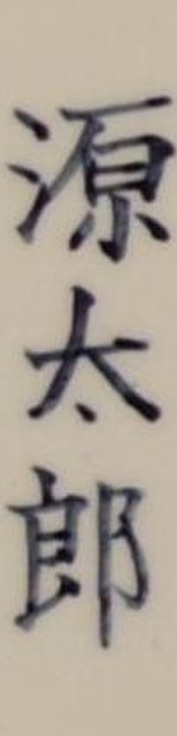源太郎

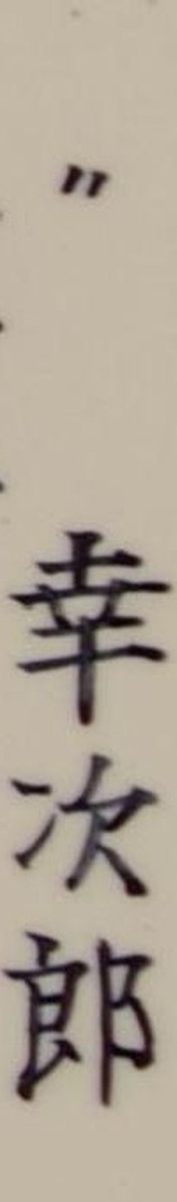幸次郎
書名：E~L
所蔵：高野山金剛峯寺
